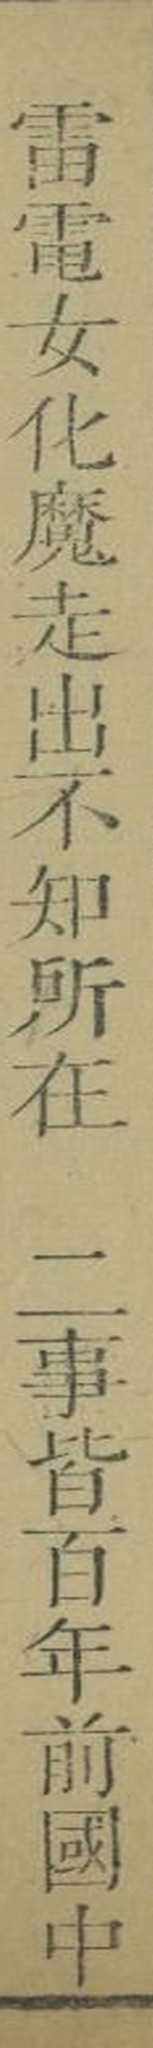雷電女化魔走出不知所在二事皆百年前國中
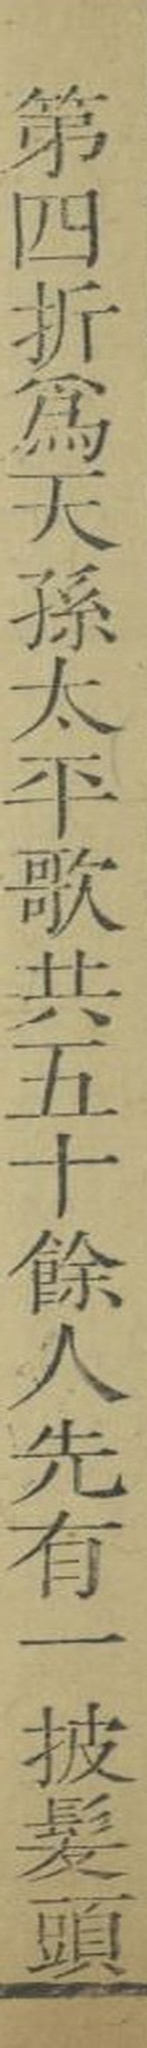第四折爲天孫太平歌共五十餘人先有一披髪頭
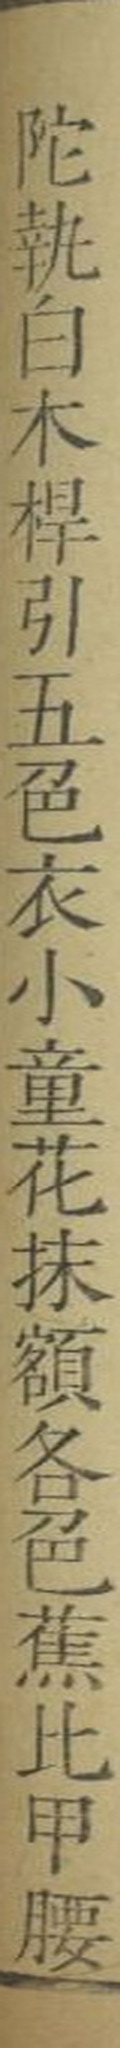陀執白木桿引五色衣小童花抹額各色蕉比甲腰
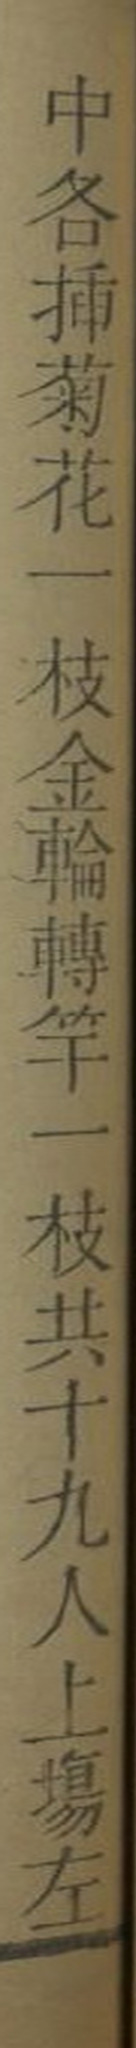中各揷菊花一枝金輪轉竿一枝共十九人上塲左
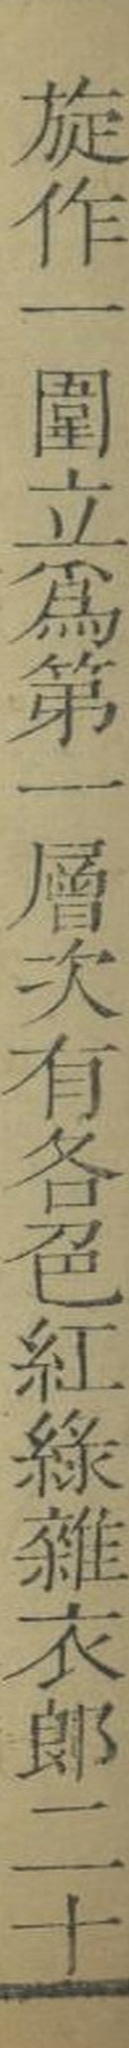旋作一圍立爲第一層次有各色紅綠雜衣郎二十
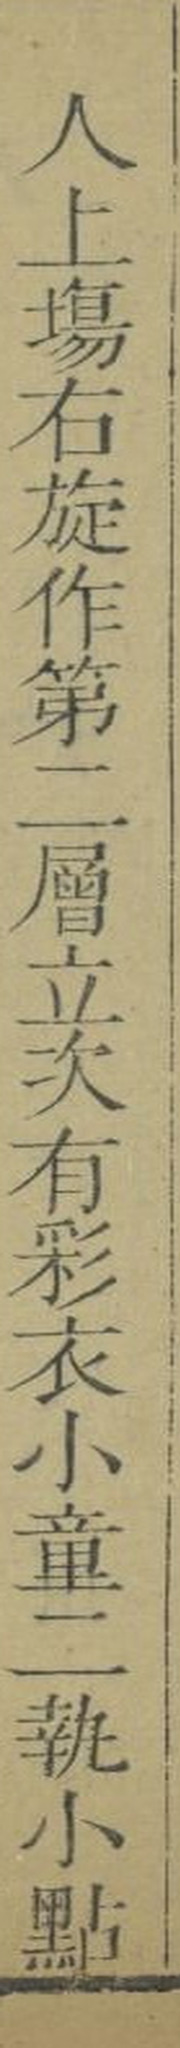人上塲右旋作第二層立次有彩衣小童二執小點
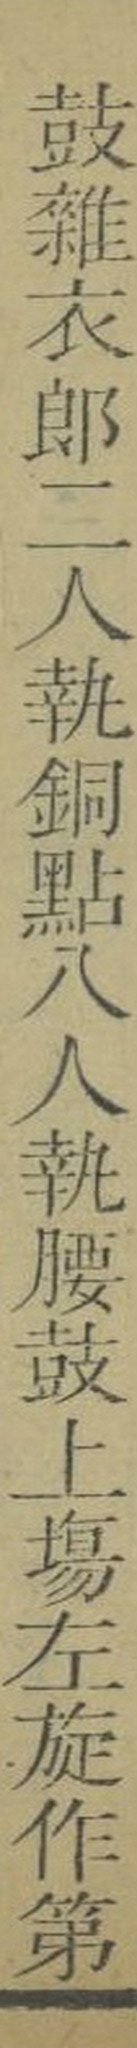鼓雜衣郎二人執銅點八人執腰鼓上塲左旋作第
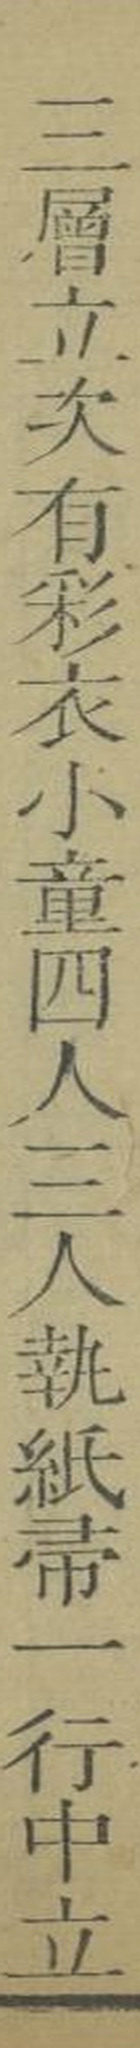三層立次有彩衣小童四人三人執紙帚一行中立
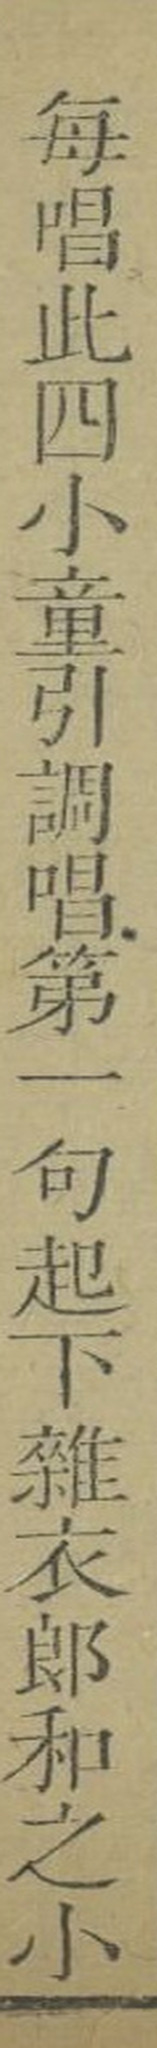每唱此四小童引調唱第一句起下雜衣郎和之小
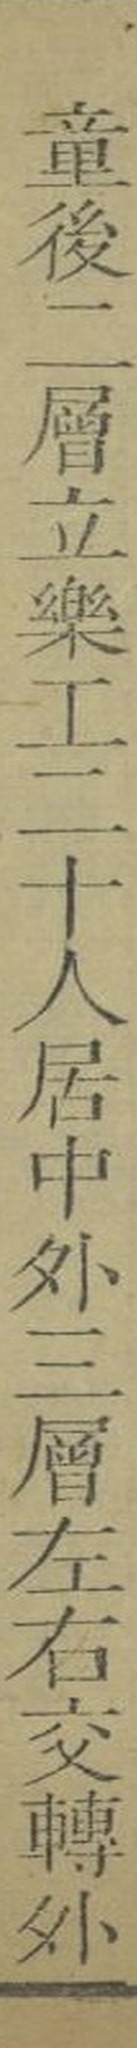童後二層立樂工二十人居中外三層左右交轉外
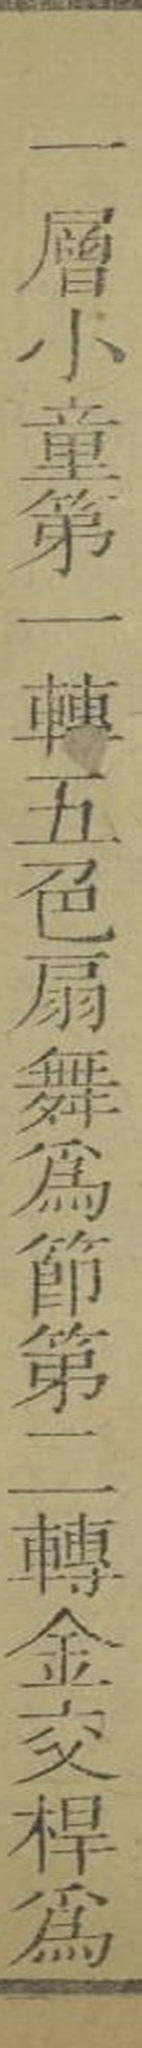一層小童第一轉五色扇舞爲節第二轉金交桿爲
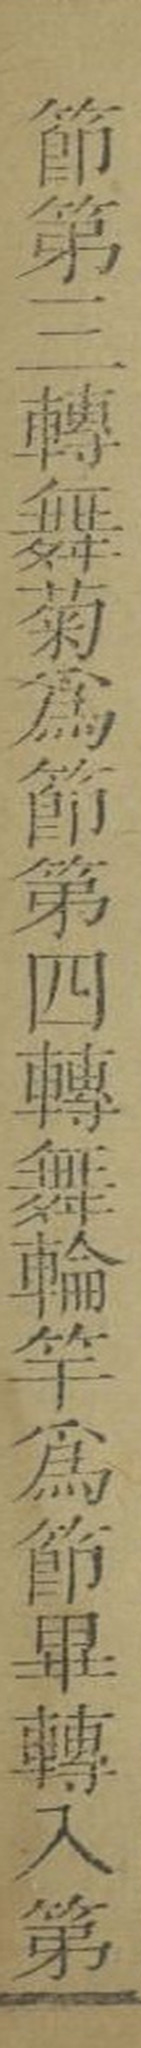節第三轉舞菊爲節第四轉舞輪竿爲節畢轉入第

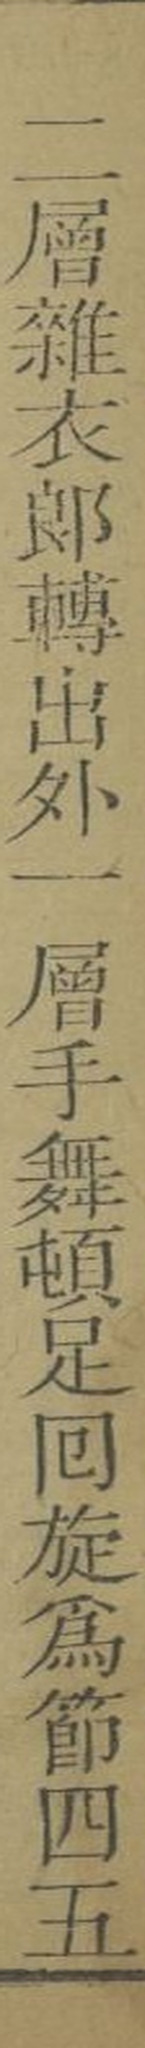二層雜衣郎轉出外一層手舞頓足囘旋爲節四五
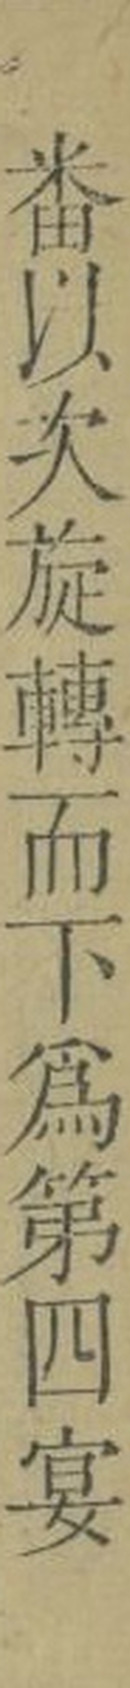畨以次旋轉而下爲第四宴
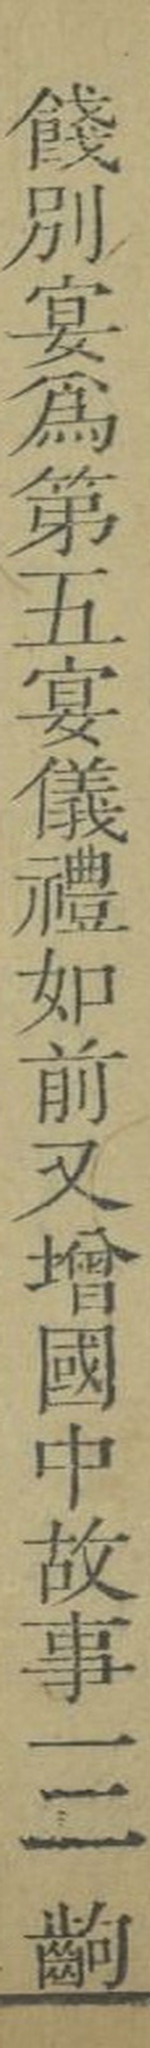餞別宴爲第五宴儀禮如前又增國中故事一二齣
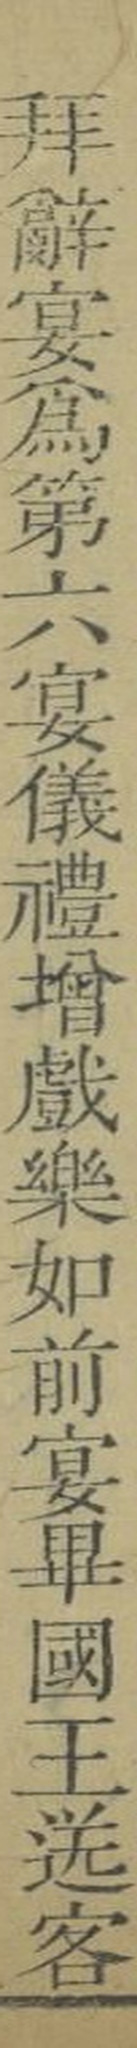拜辭宴爲第六宴儀禮增戲樂如前宴畢國王送客
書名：中山伝信録 巻二
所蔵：University of the Ryukyus Library
